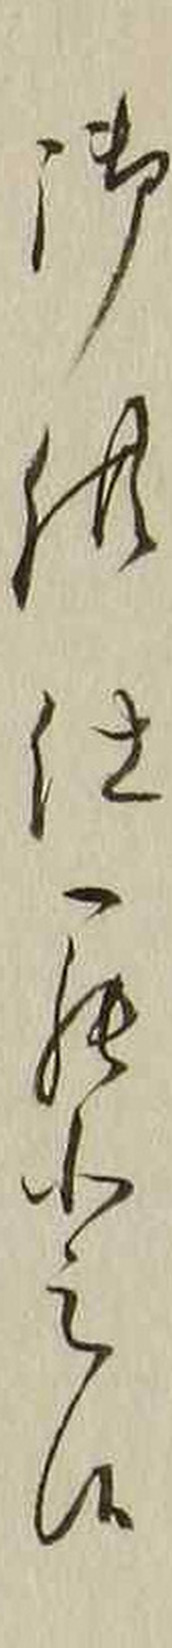御供仕罷登候
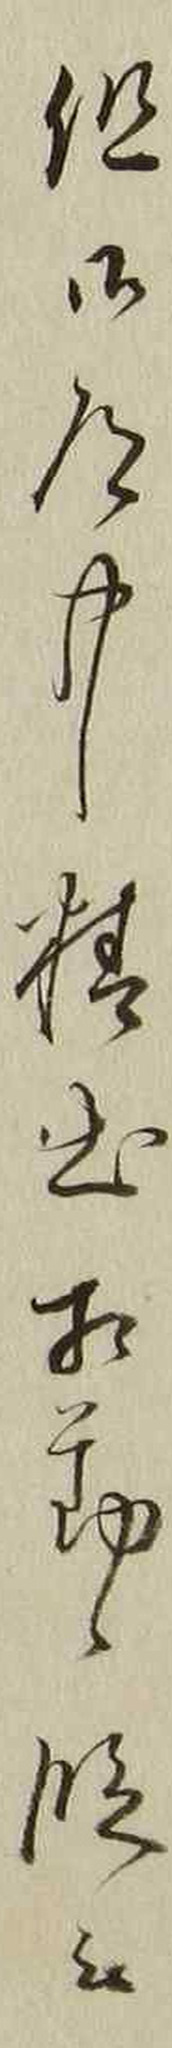但御道中精出相勤候段被
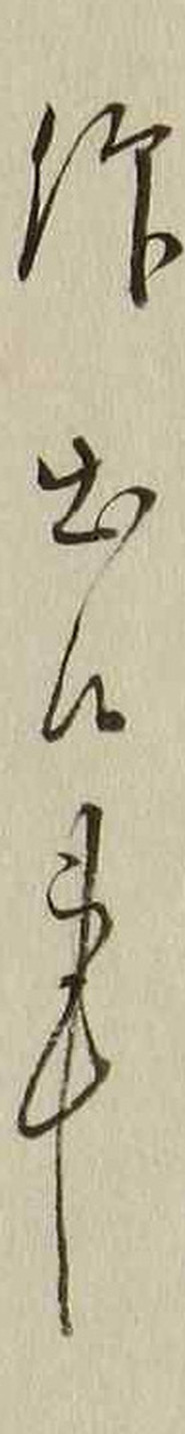仰出候事
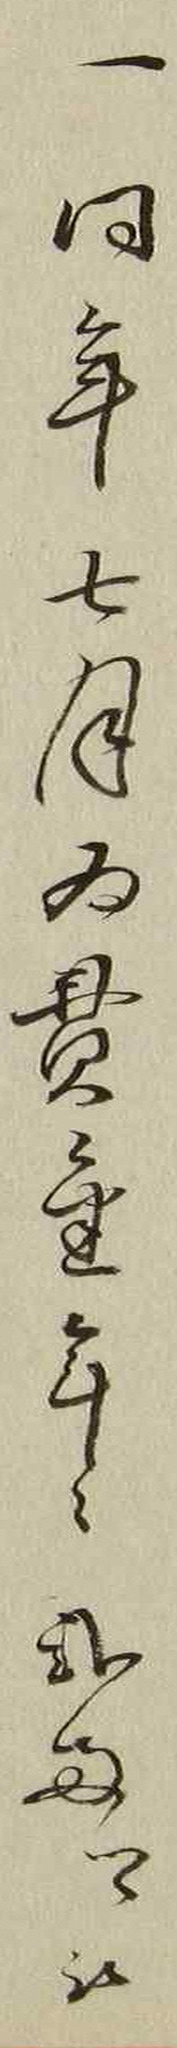一同年七月為費金年々弐両ツヽ被
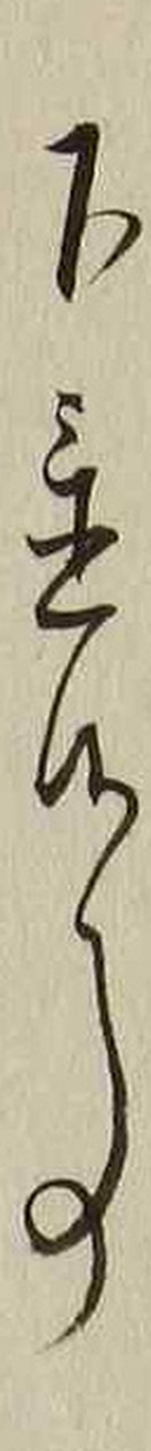下置候事
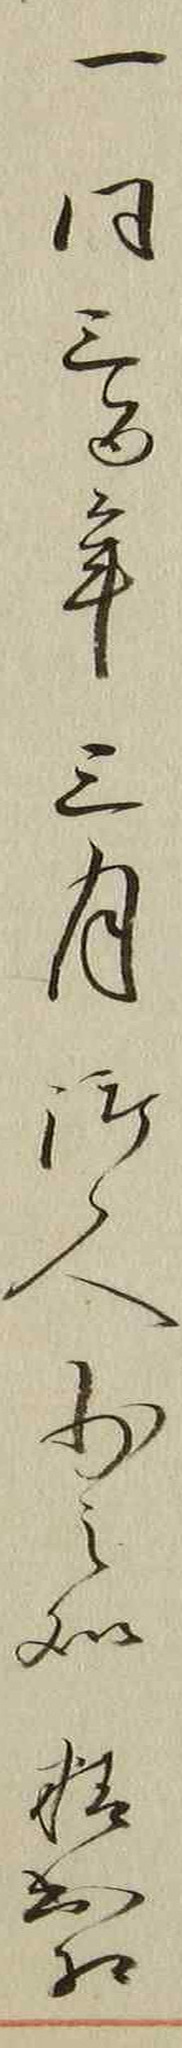一同三酉年三月御人少之処精出相
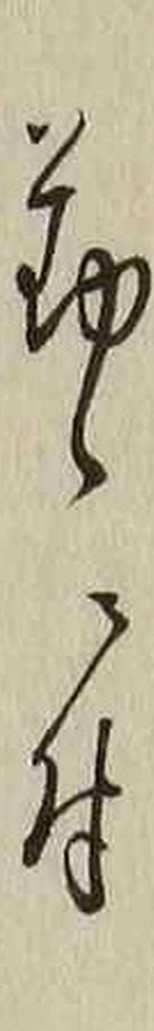勤候ニ付
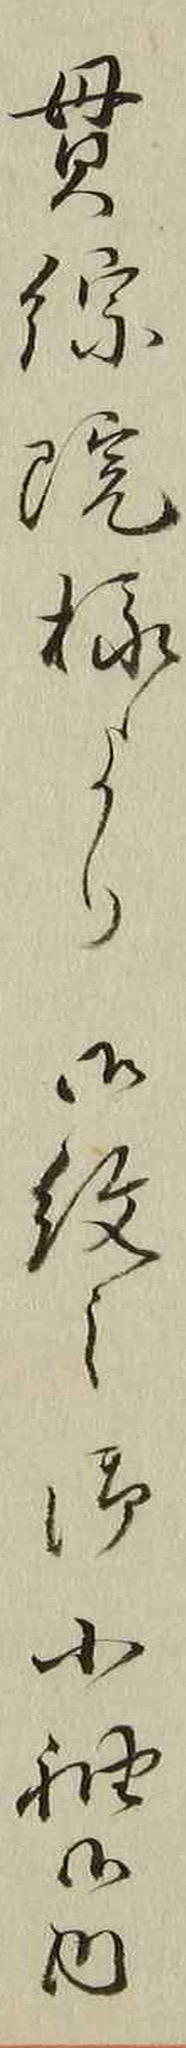貫綜院様より御紋之御小袖御内
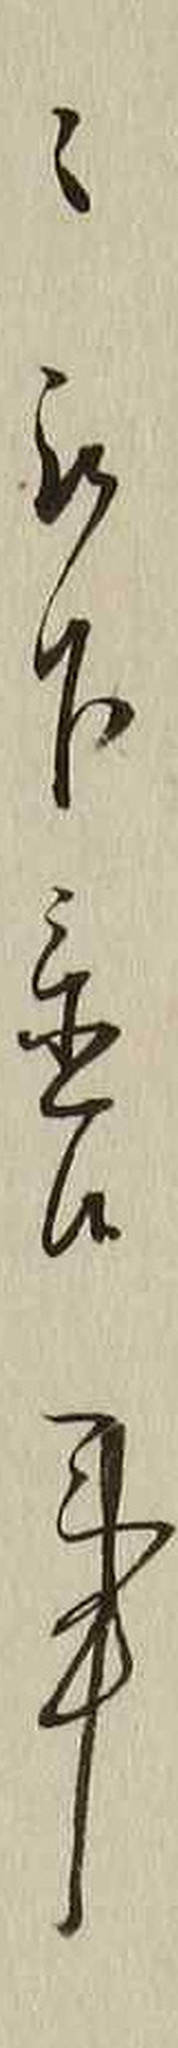々被下置候事
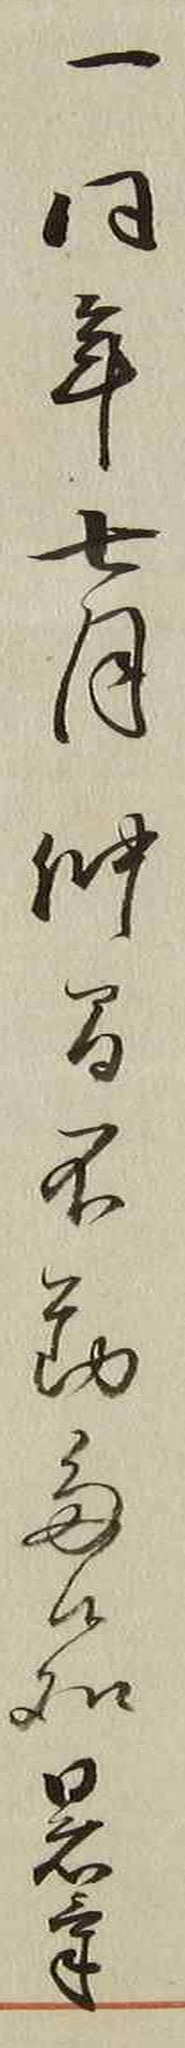一同年七月仲間不勤多候処暑気
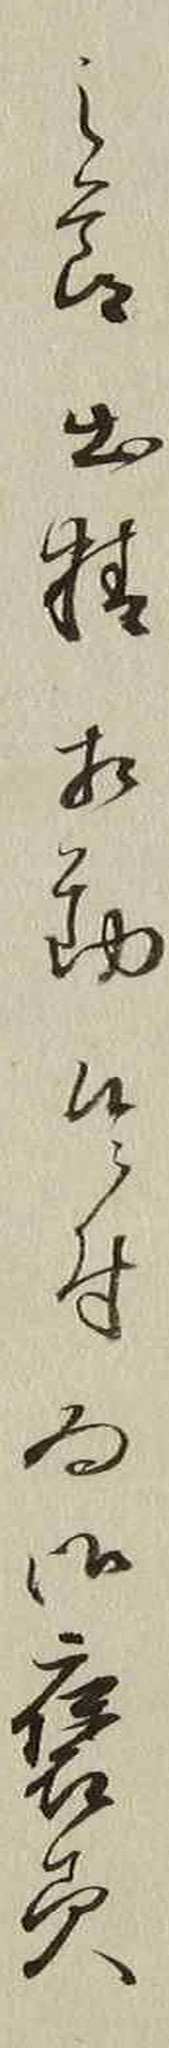之節出精相勤候ニ付為御褒美
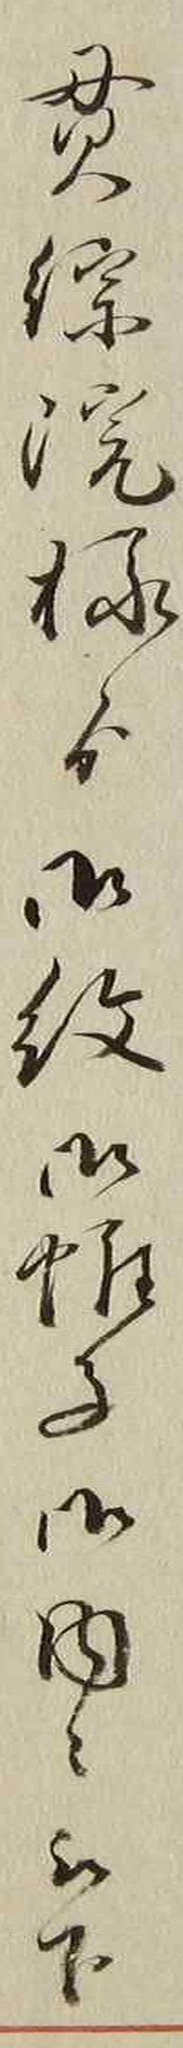貫綜院様ゟ御紋御帷子御内々被下
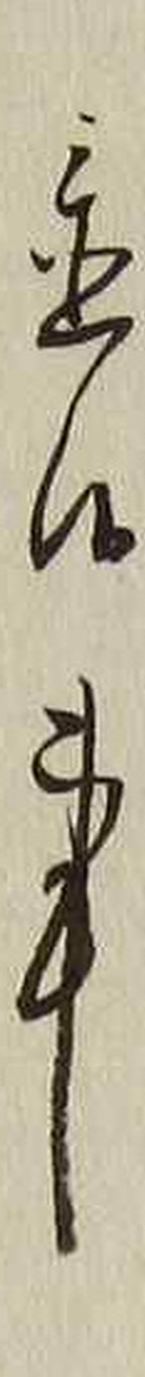置候事
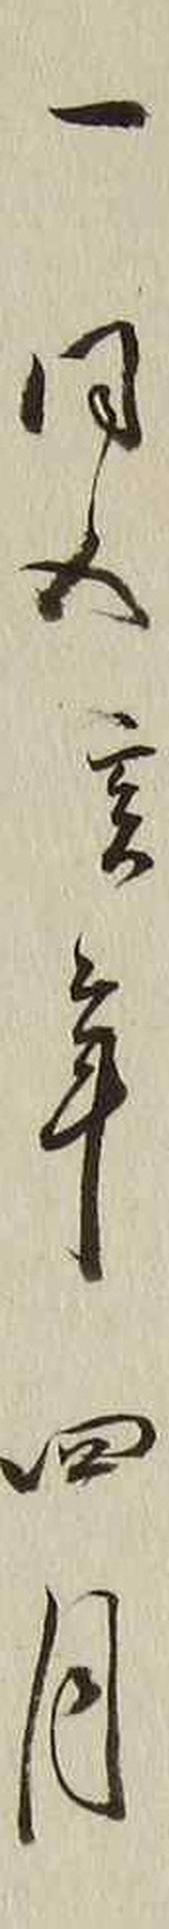一同五亥年四月
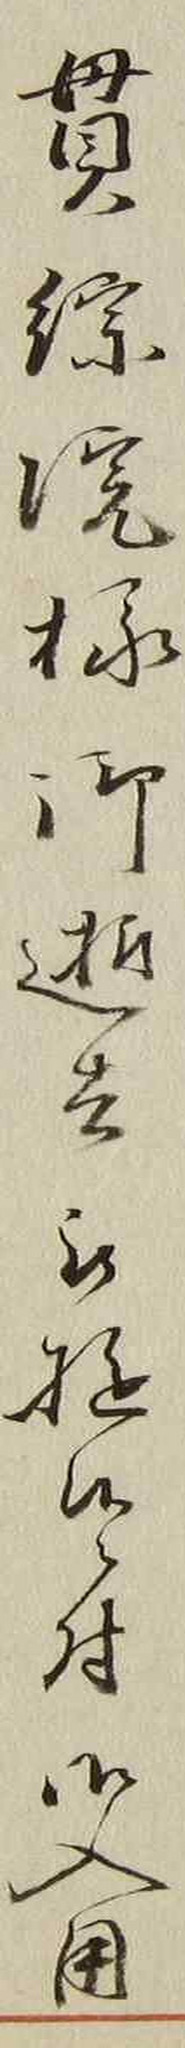貫綜院様御逝去被遊候ニ付御入用
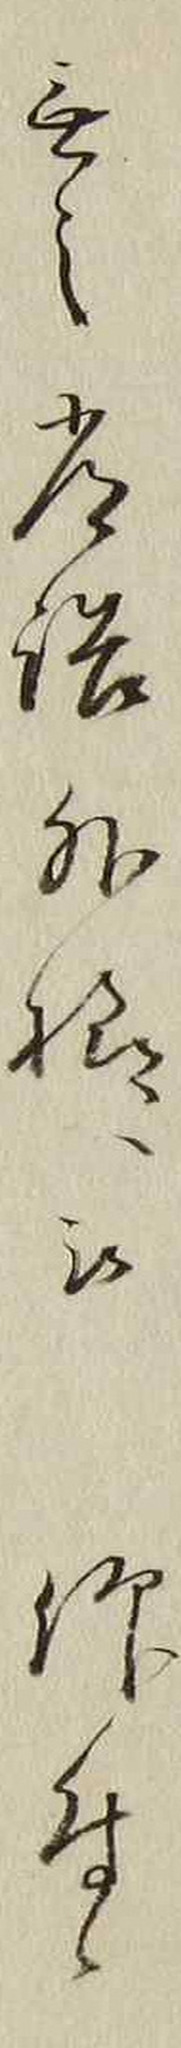無之常詰外様へ被仰付候
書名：諸士系譜　巻之28　い之部28
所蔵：会津若松市立会津図書館
